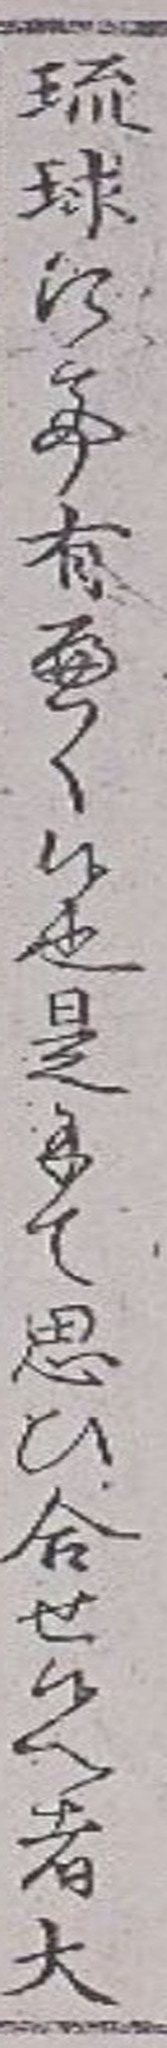琉球にて有へく候也是にて思ひ合せ候へは大

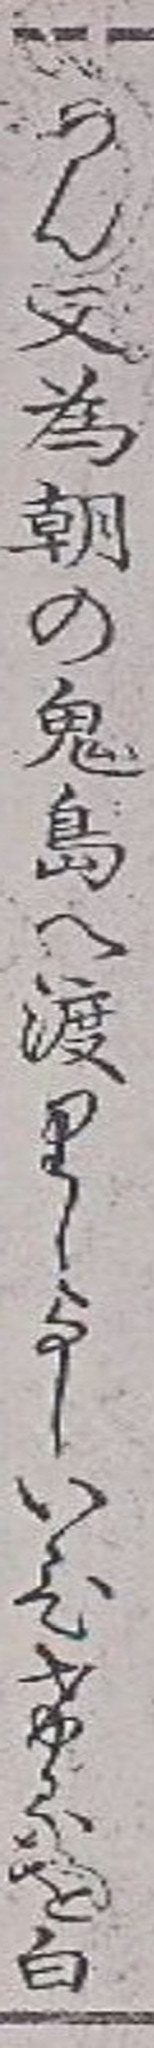らん又為朝の鬼島へ渡りしよしいひけるを白
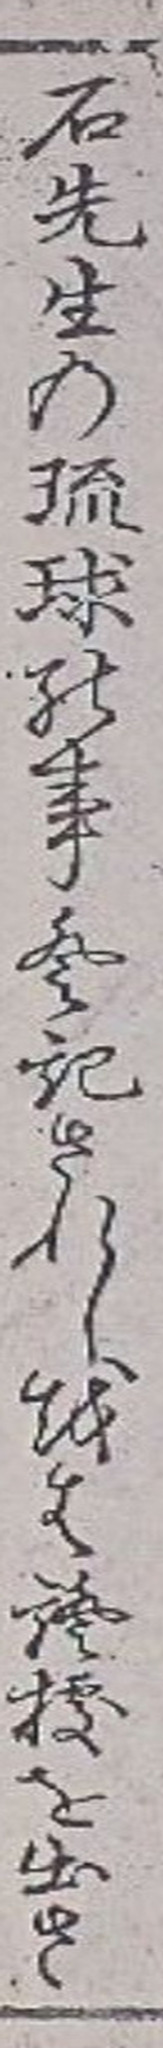石先生の琉球の事と記されしをは証拠を出さ
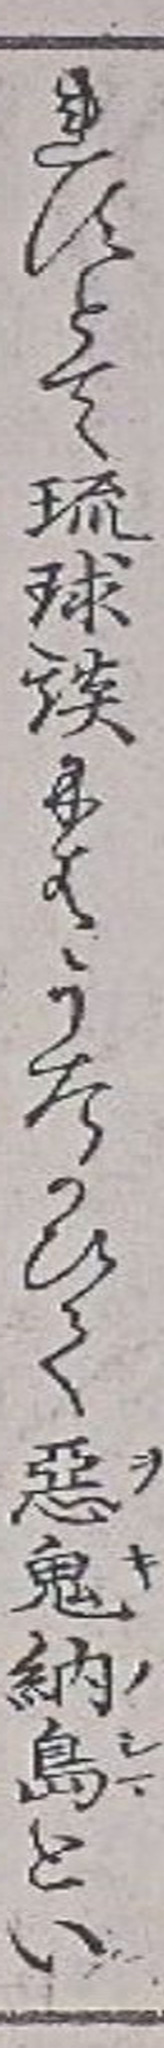れすとて琉球談にはうたかひて悪鬼納島とい
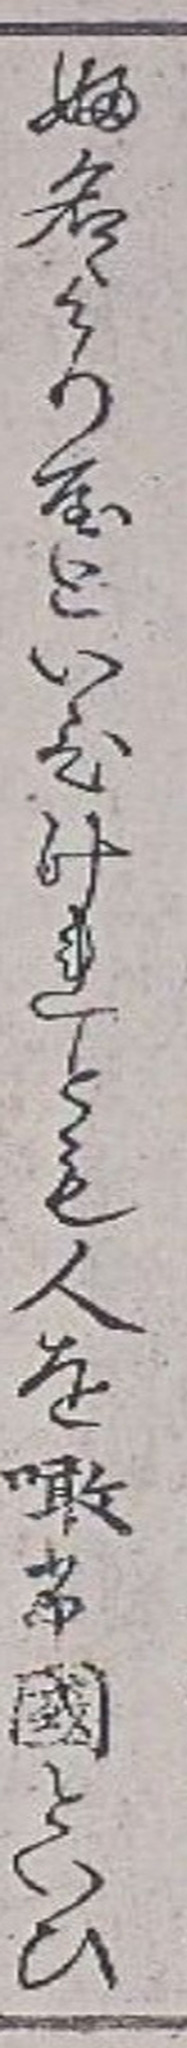ふ名よりやといひけれとも人を噉ふ国といひ
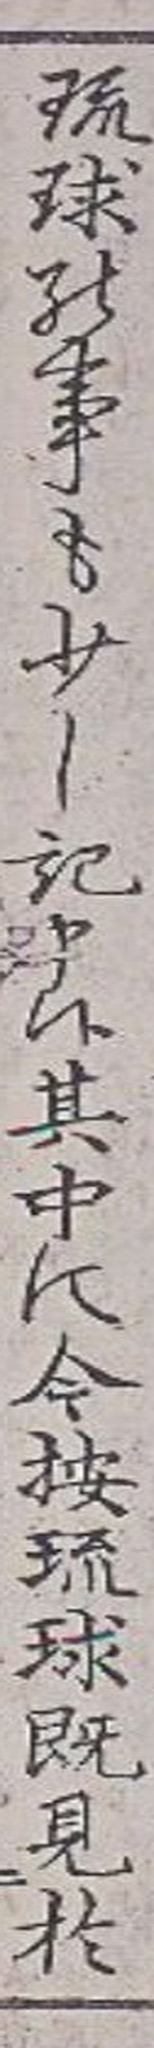琉球の事も少し記申候其中に今按琉球既見於
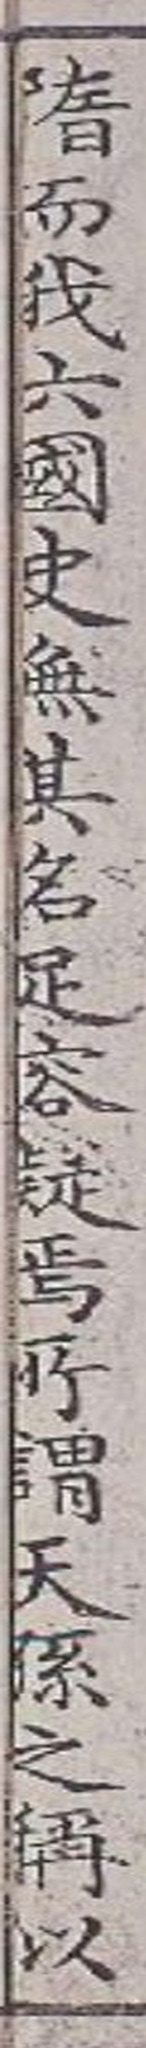隋而我六国史無其名足容疑焉所謂天孫之称以
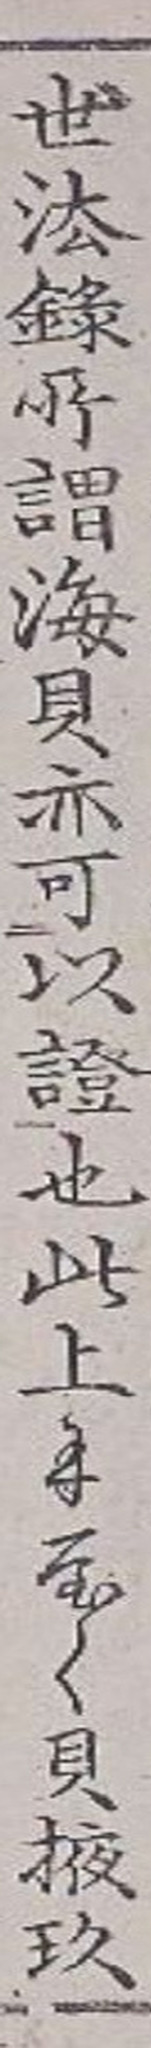世法録所謂海貝亦可以証也此上ににやく貝掖玖
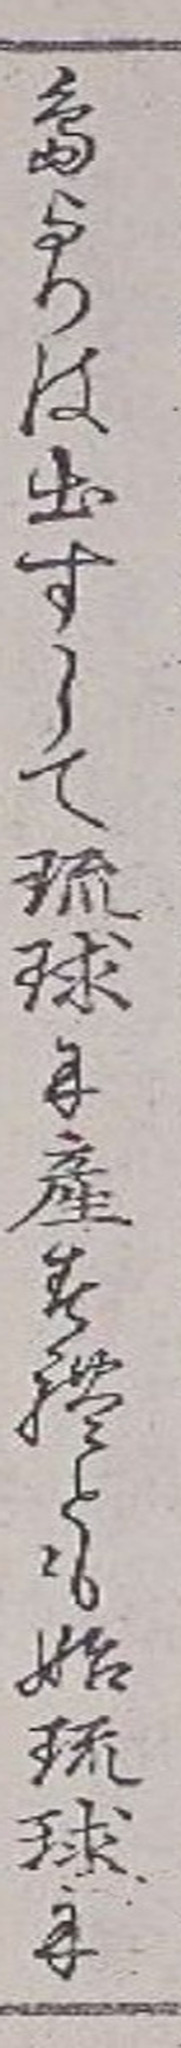島よりは出すして琉球に産すれとも始琉球に
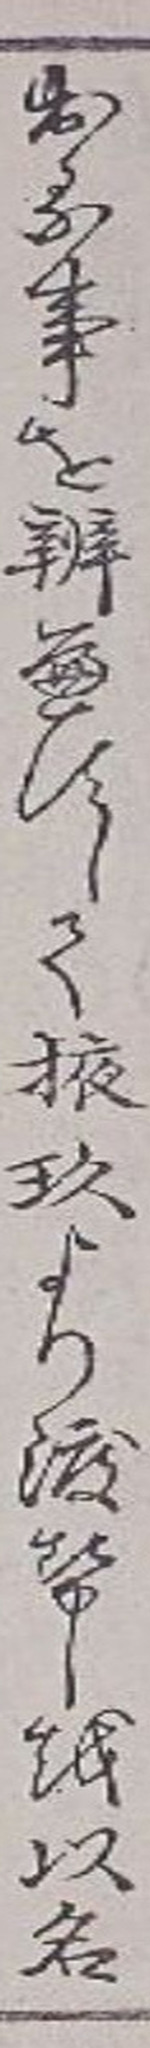出る事を弁へすして掖玖より渡せしを以名
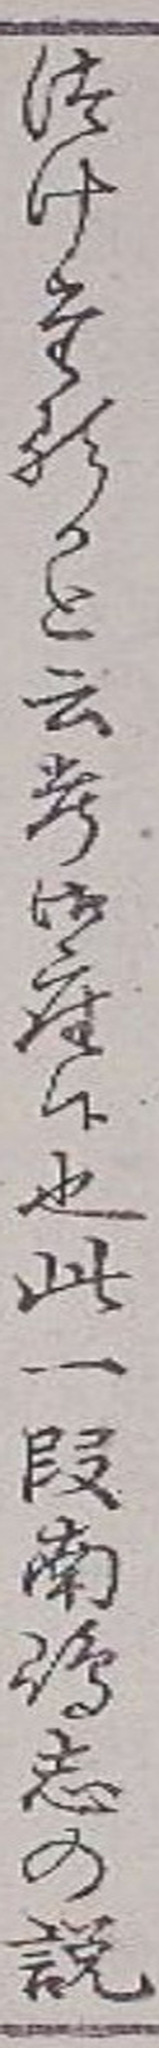つけたるかと云考御座候也此一叚南島志の説
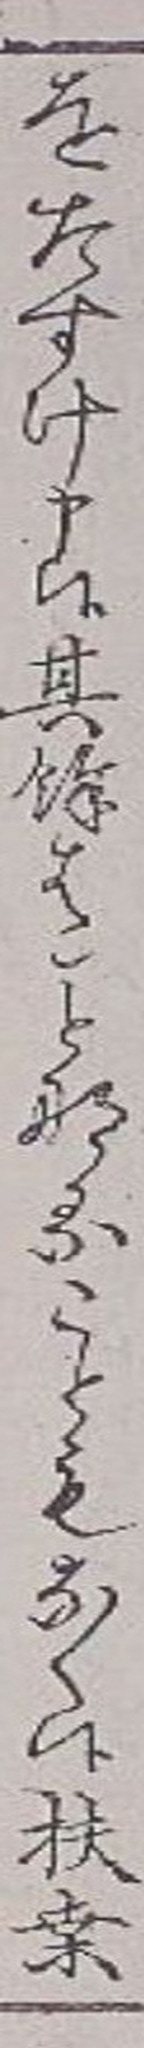をたすけ申候其余はことなることもなく候扶桑
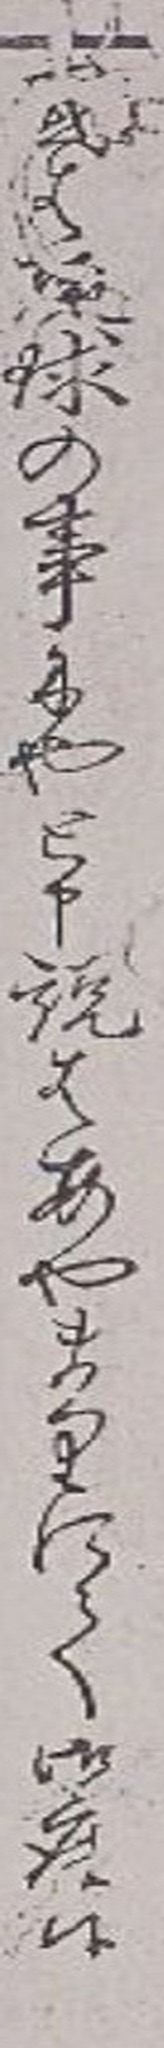国は琉球の事にやと申説はあやまりにて御座候
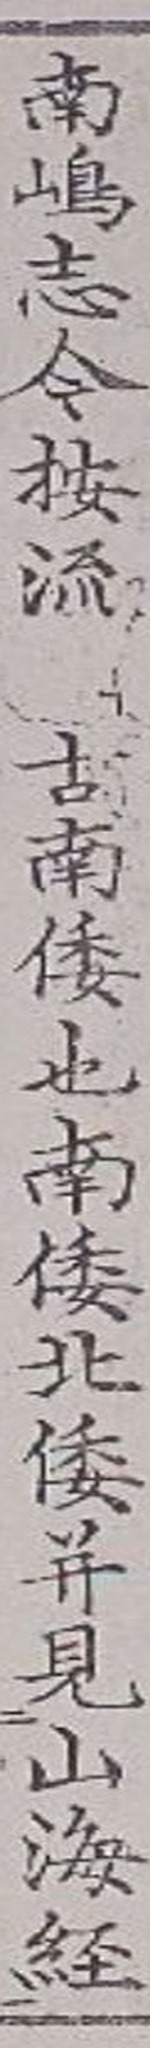南島志今按流古南倭也南倭北倭并見山海経
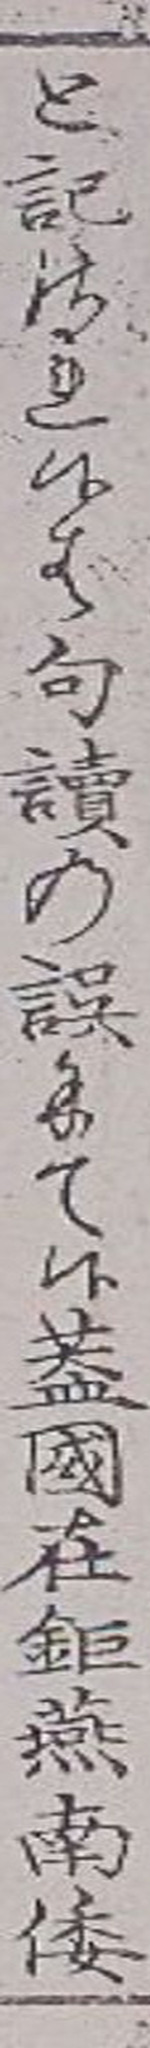と記され候は句読の誤にて候蓋国在鉅燕南倭

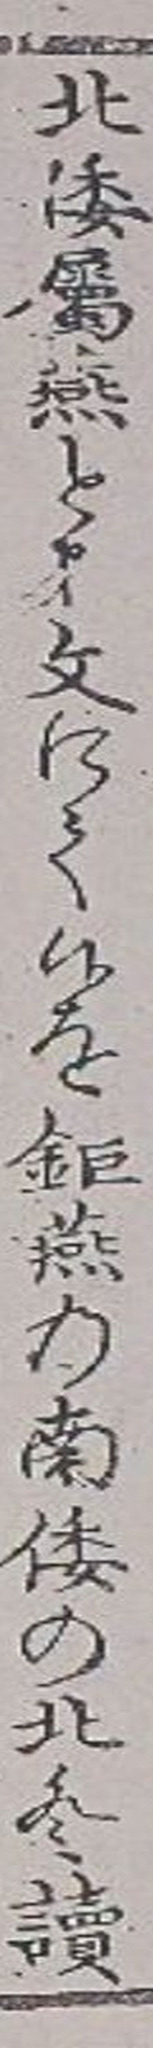北倭属燕と申文にて候を鉅燕の南倭の北と読
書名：琉球状
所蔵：University of the Ryukyus Library
